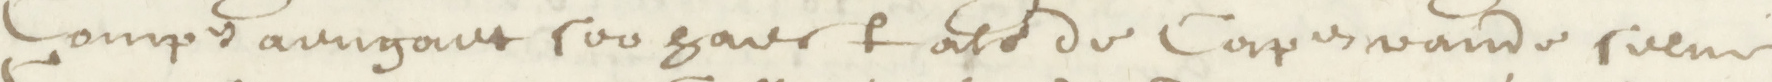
Compen aengaet soo haest als de Capen vande selue
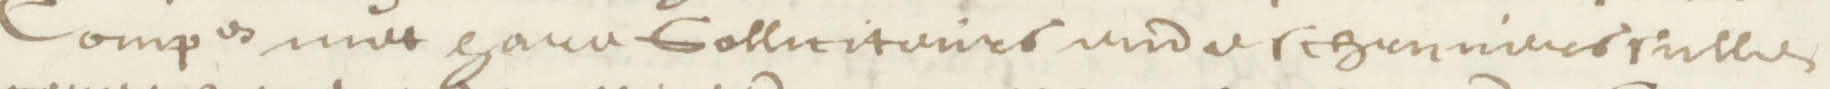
Compen met hare Solliciteurs ende schryvers sullen
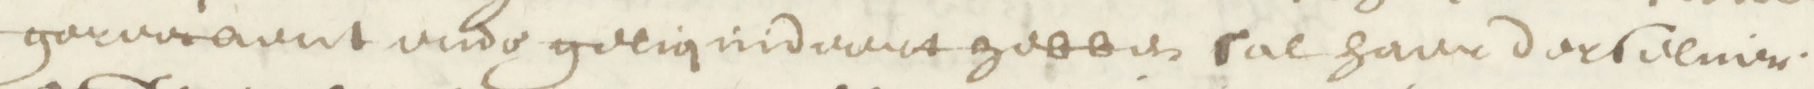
gereeckent ende geliquideert hebben sal haer derseluer
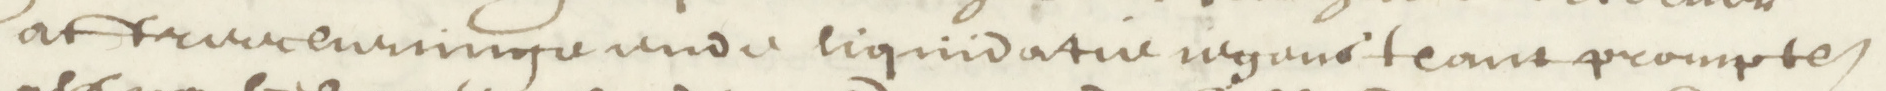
affreeckeninge ende liquidatie iegens tlant promptl
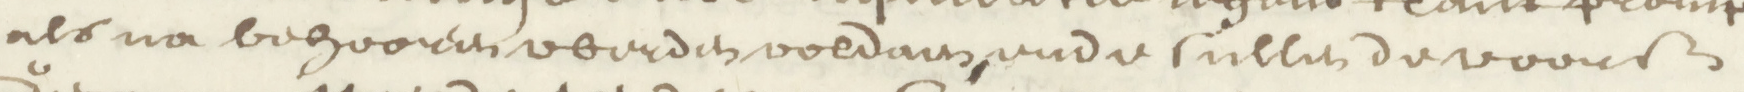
als na behooren werden voldaen ende sullen de voors
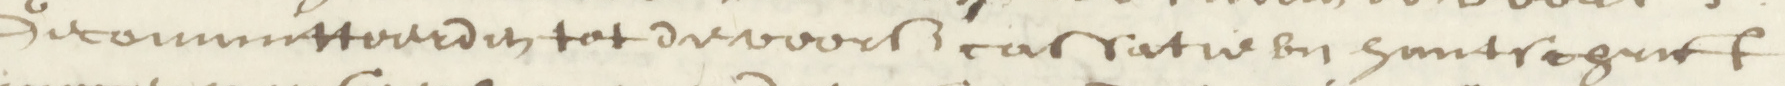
Gecommitteerden tot de voors cassatie by hantschrift
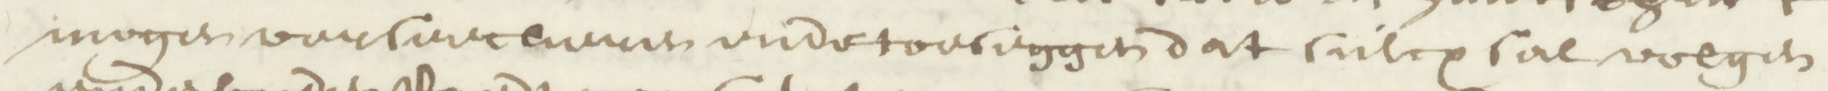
mogen verseeckeren ende toeseggen dat sulcx sal volgen
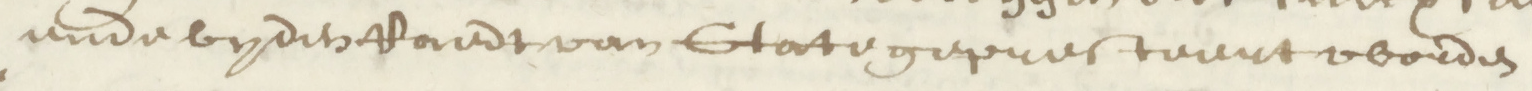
ende byden Raedt van State gepresteert worden
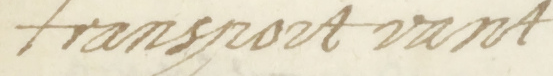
transport vant
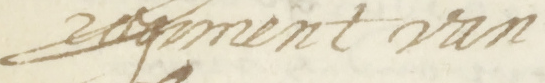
regiment van
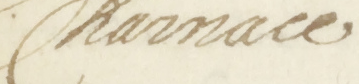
Charnace
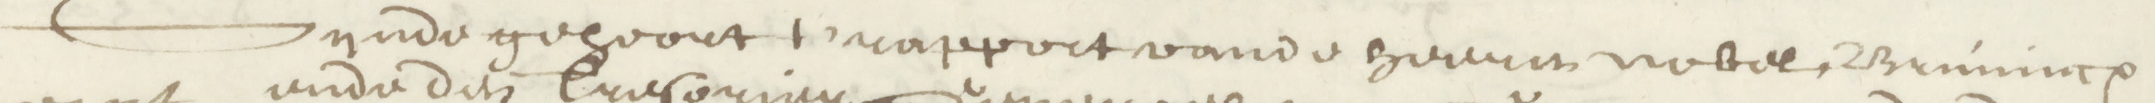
Synde gehoort t' rapport vande heerin Nobel, Brunincx
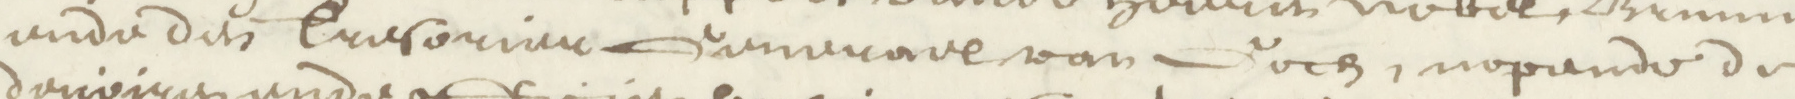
ende den Tresorier Generael van Goch, nopende de
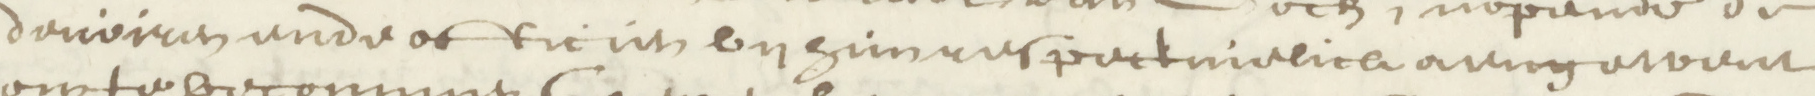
deuoiren ende officien by hun respectiuelick aengewent
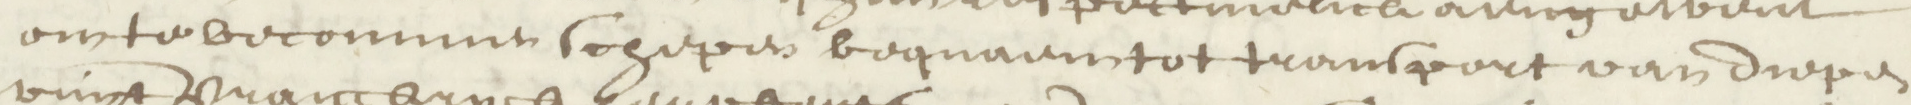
om te becommen schepen bequaem tot transport van diepen
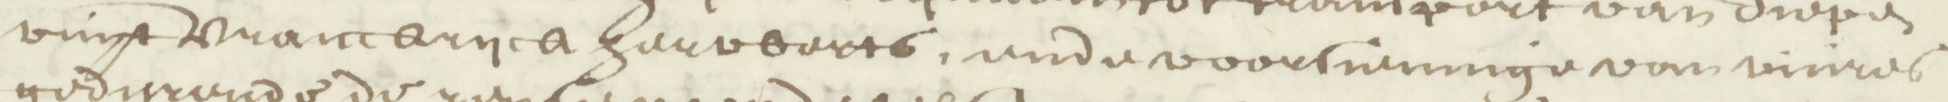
vuyt Vranckryck herwerts, ende voorsieninge van viures
